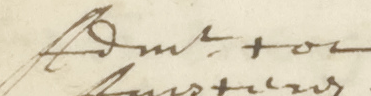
Admt. tot
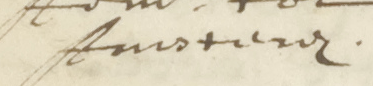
Amsterd.
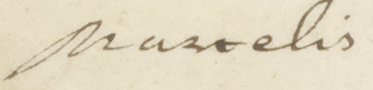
Marcelis
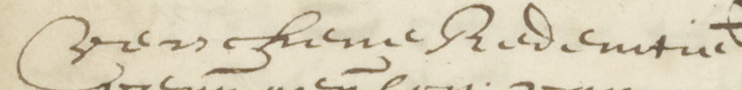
verschene Redemtie
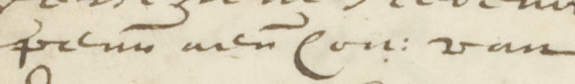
penn aen Con: van
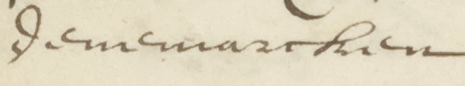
Denemarcken
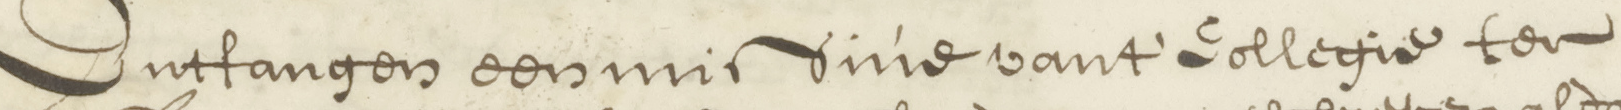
Ontfangen een missiue vant' Collegie ter
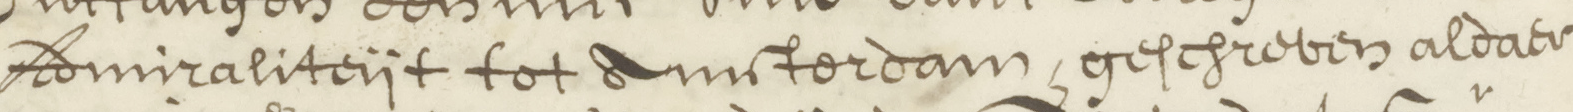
Admiraliteijt tot Amsterdam, geschreven aldaer
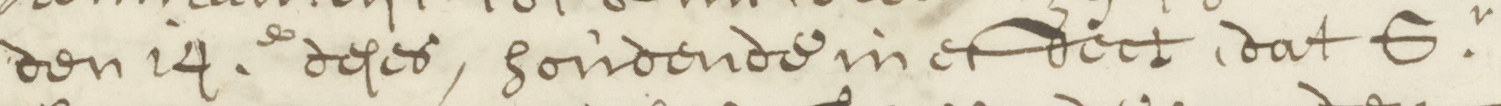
den 14e. deses, houdende in effect, dat Sr.
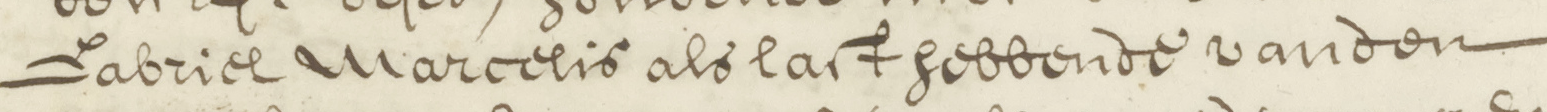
Gabriel Marcelis als last hebbende vanden
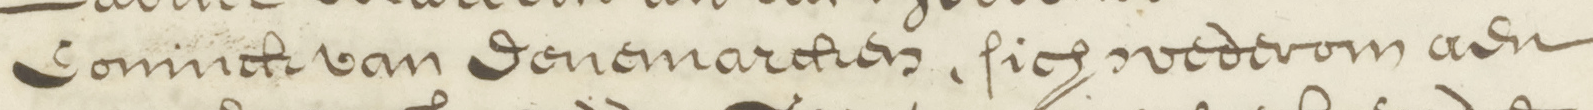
Coninck van Denemarcken, sich wederom aen
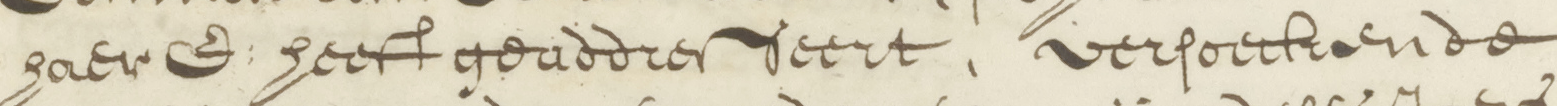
haer E: heeft geaddresseert, versoeckende
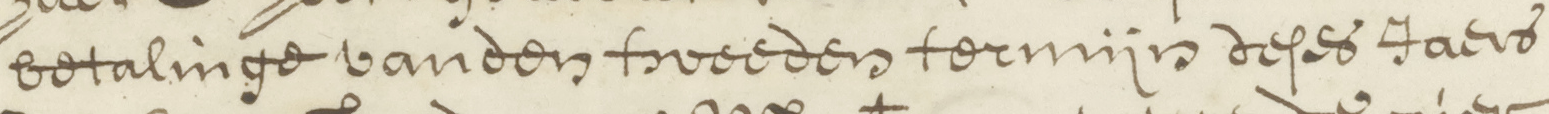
betalinge vanden tweeden termijn deses Jaers
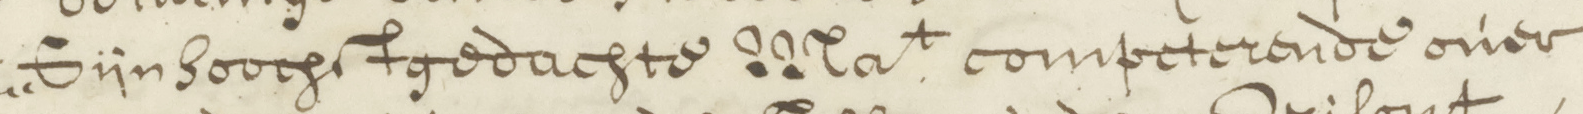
Sijn hoochstgedachte Mat. competerende ouer
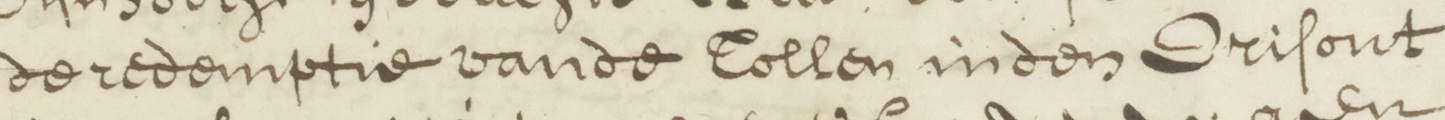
de redemptie vande Tollen in den Orisont,
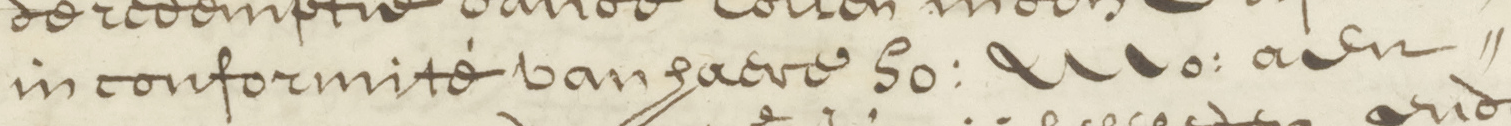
in conformité van haere ho:Mo: aen„
